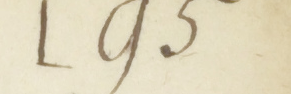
195
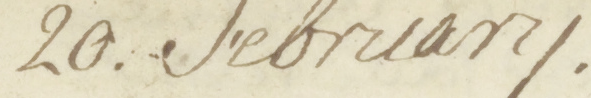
20. February.
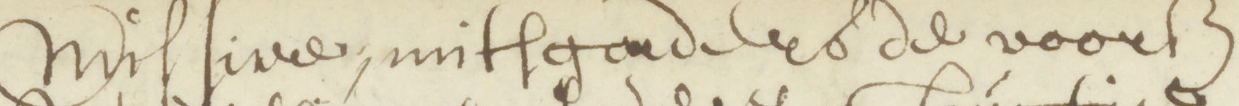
Missive, mitsgaders de voors
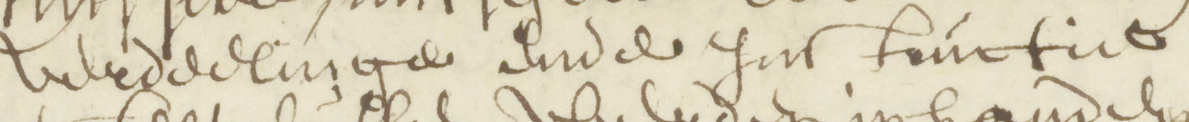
verdeelinge ende Instructie
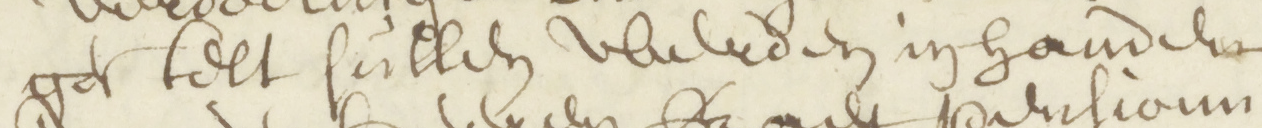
gestelt sullen werden in handen
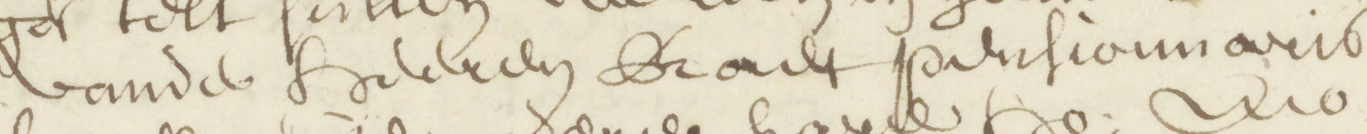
vande Heeren Raet Pensionnaris
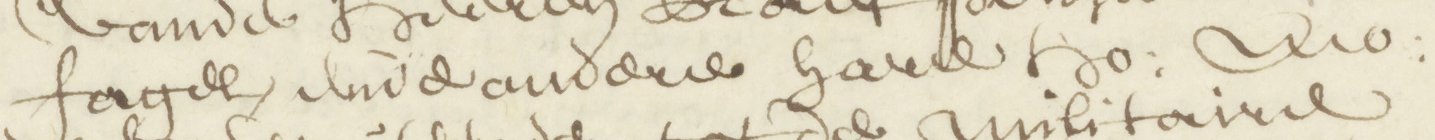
Fagel, ende andere hare Ho:Mo:
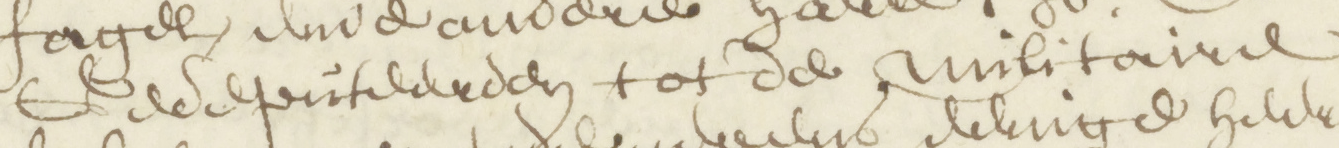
Gedeputeerden tot de militaire
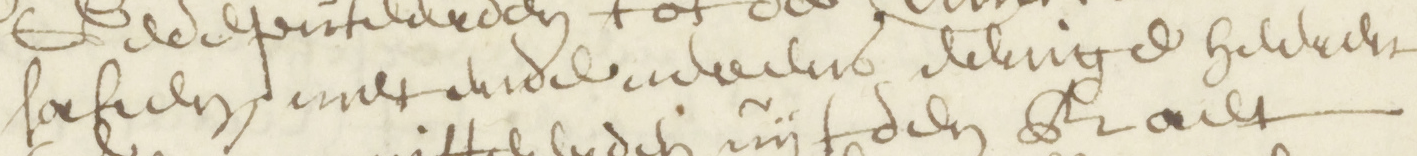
saken, met ende nevens eenige heeren
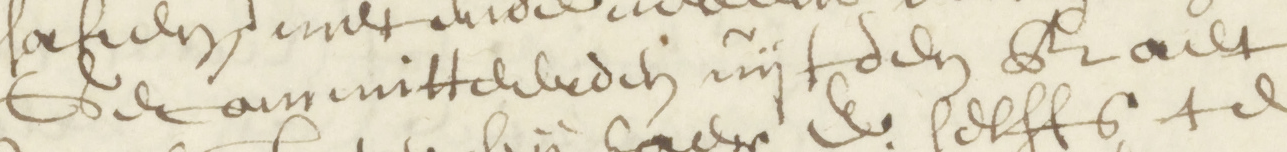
Gecommitteerden uijt den Raet
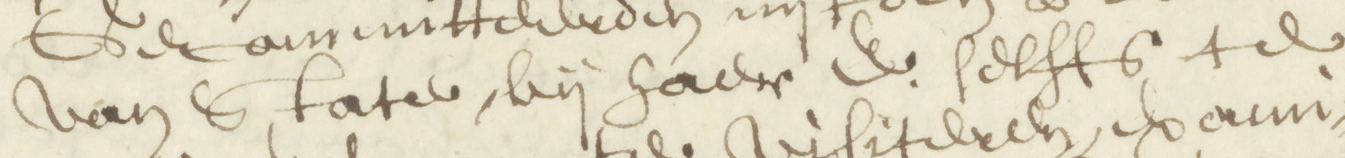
van State, bij haer E. selffs te
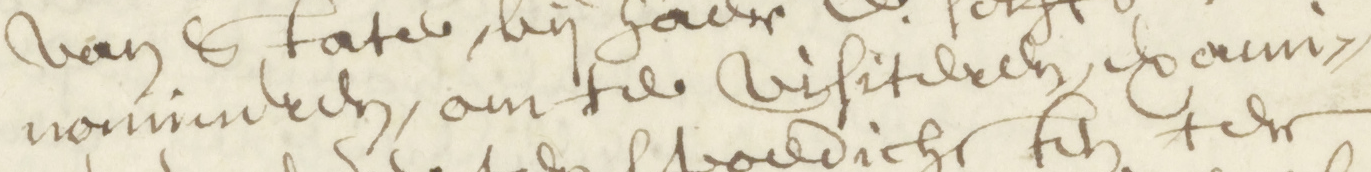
nomineren, om te visiteren, exami„
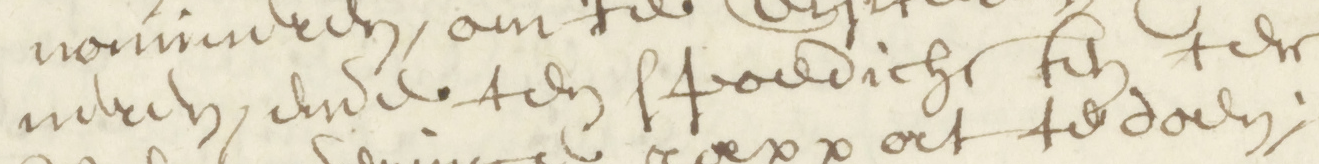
neren, ende ten spoedichsten ter
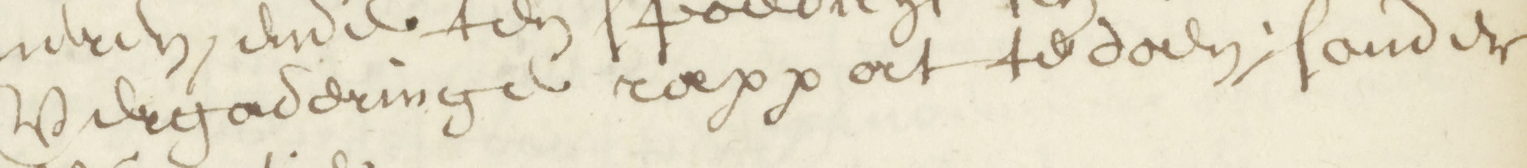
Vergaderinge rapport te doen; sonder
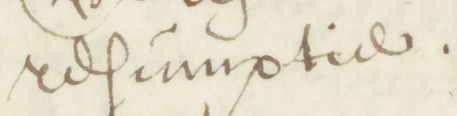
resumptie.
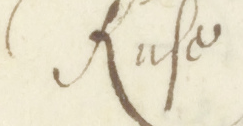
Ruse
